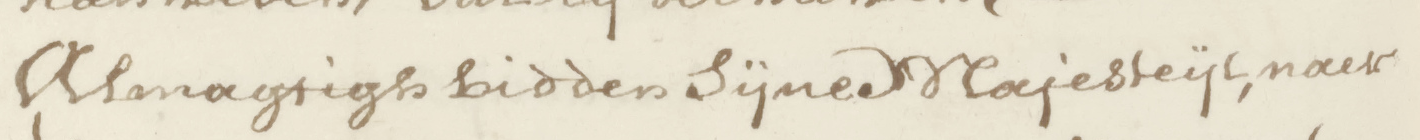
Almagtigh bidden Sijne Majesteijt, naer
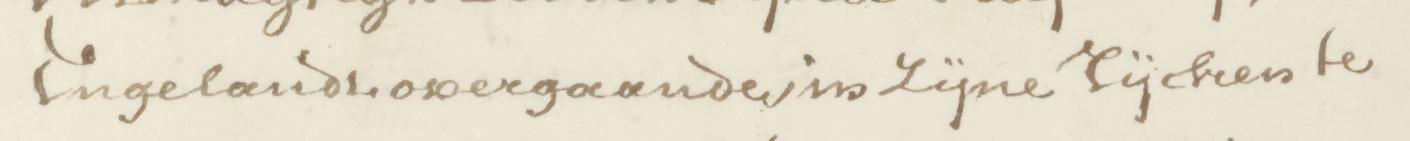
Engelandt overgaande, in zijne rijcken te
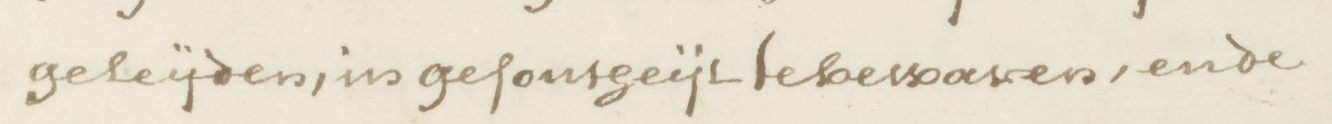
geleijden, in gesontheijt te bewaren, ende
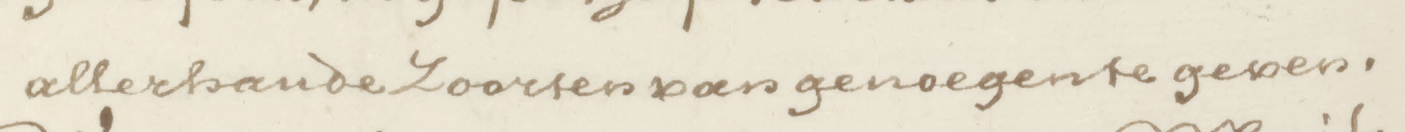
allerhande zoorten van genoegen te geven.
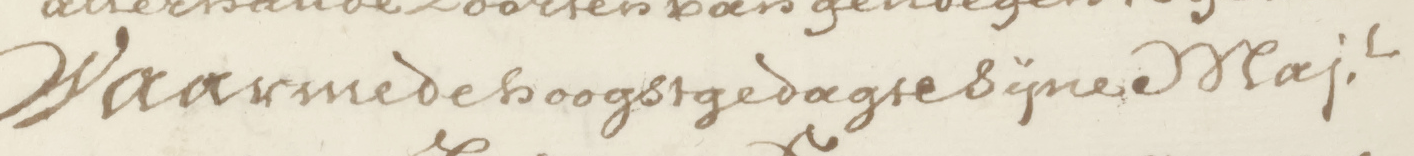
Waarmede de hoogstgedagte Sijne Majt
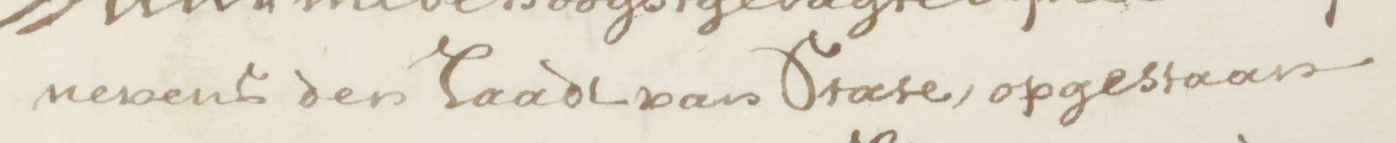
nevens den Raadt van State, opgestaan
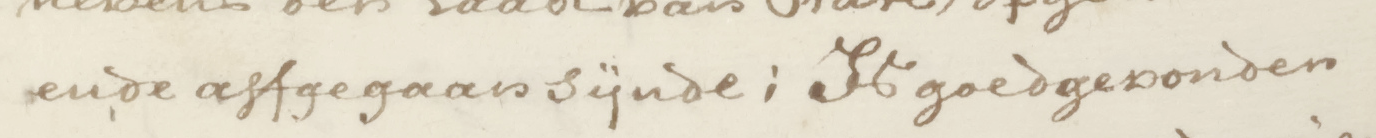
ende affgegaan sijnde: Is goedgevonden
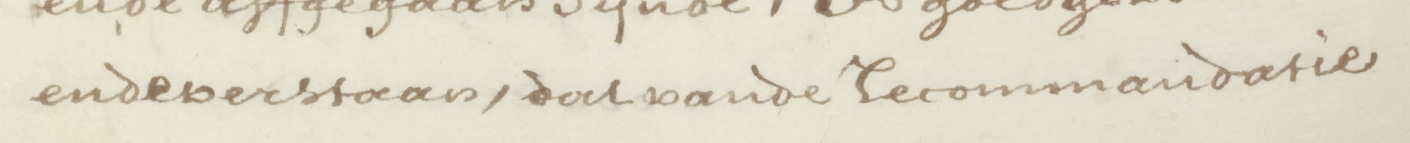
ende verstaan, dat vande recommandatie
